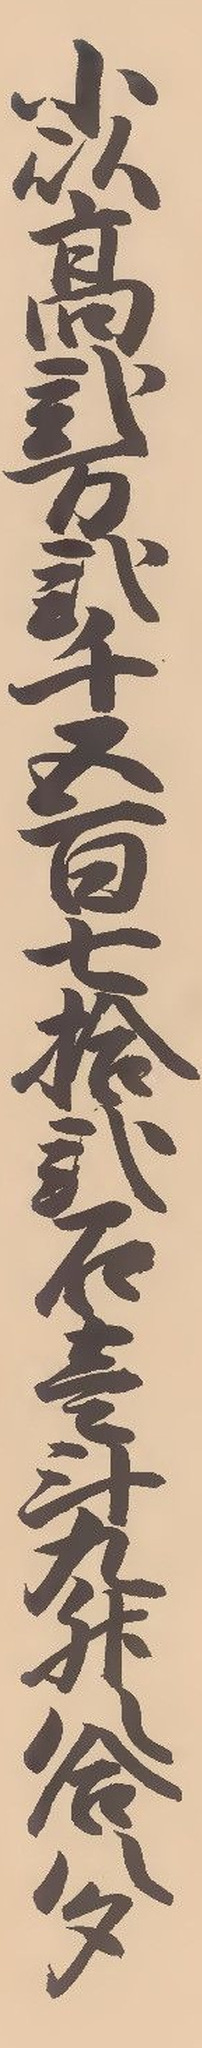小以高弐万弐千五百七拾弐石壱斗九升八合八勺
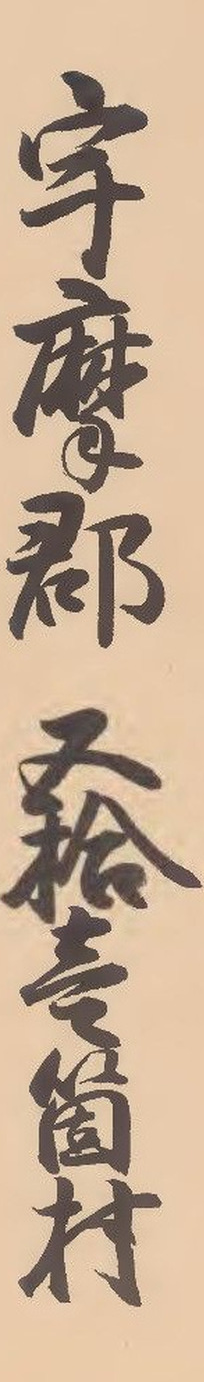宇摩郡五拾壱箇村
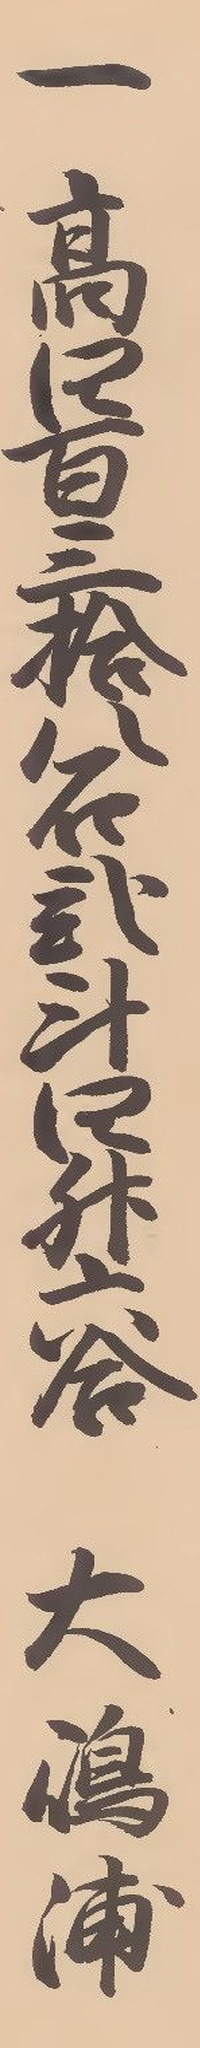一高四百三拾八石弐斗四升六合大島浦
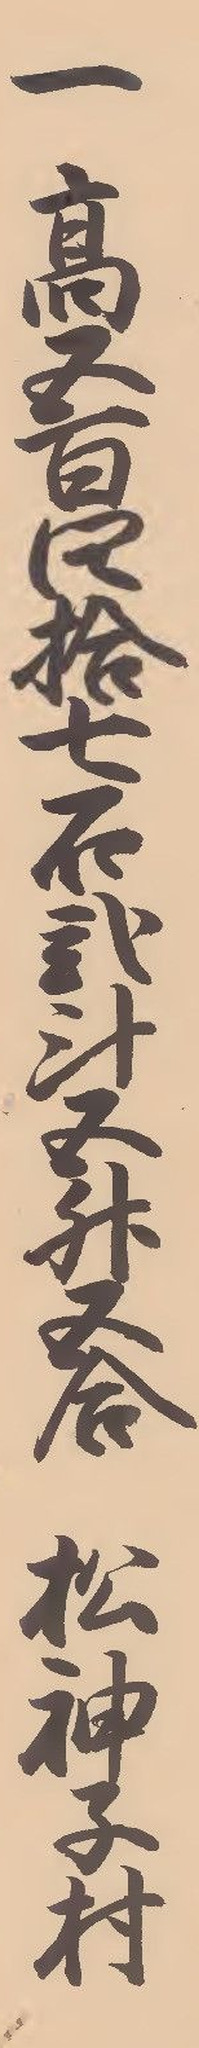一高五百四拾七石弐斗五升五合松神子村

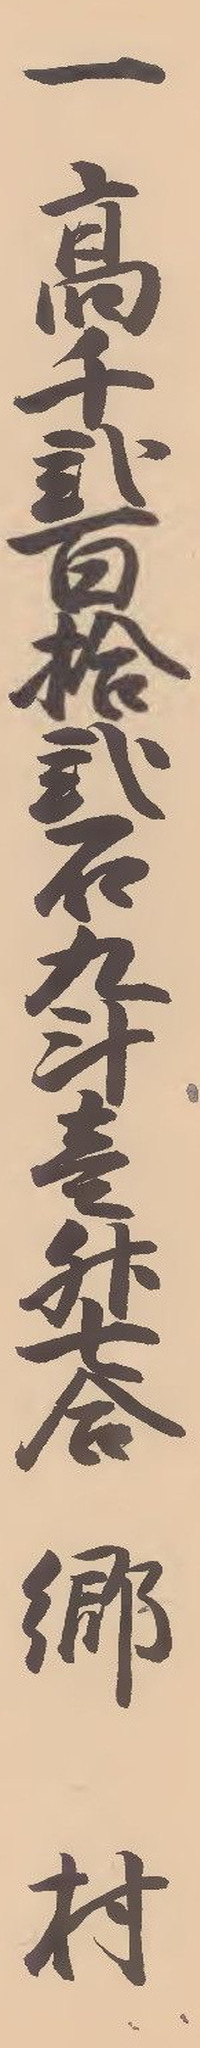一高千弐百拾弐石九斗壱升七合郷村
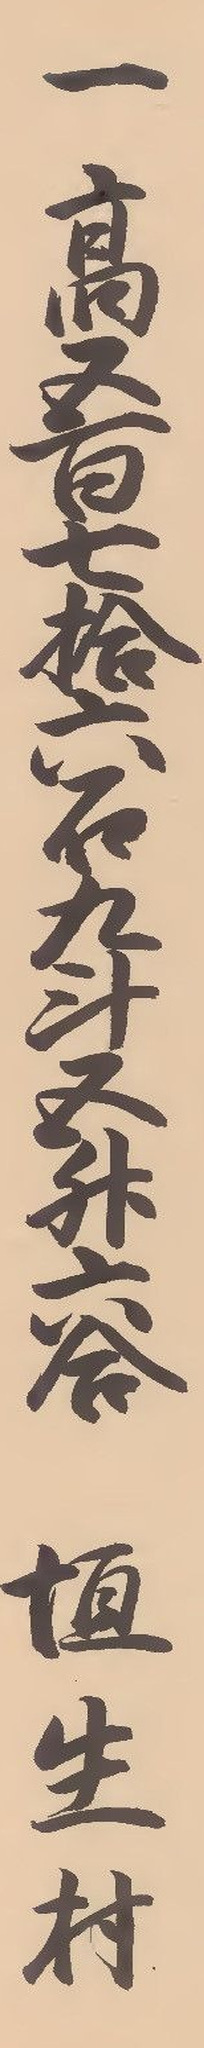一高五百七拾六石九斗五升六合垣生村
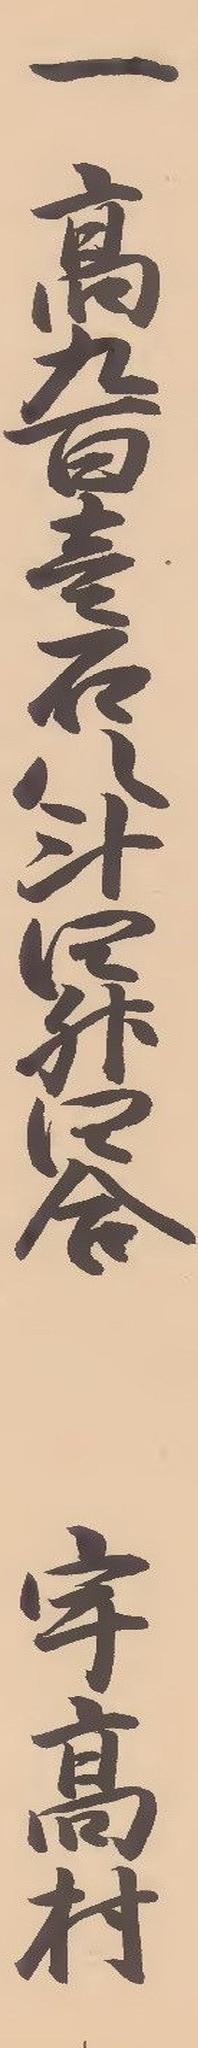一高九百壱石八斗四升四合宇高村
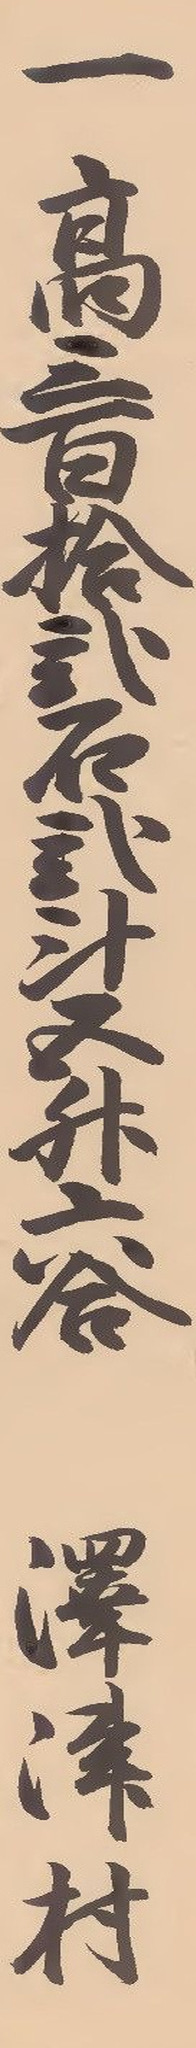一高三百拾弐石弐斗五升六合沢津村
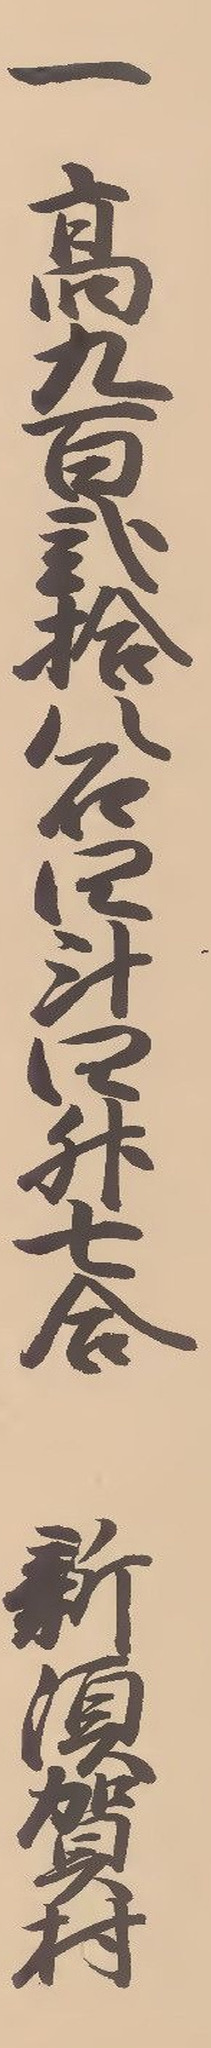一高九百弐拾八石四斗四升七合新須賀村
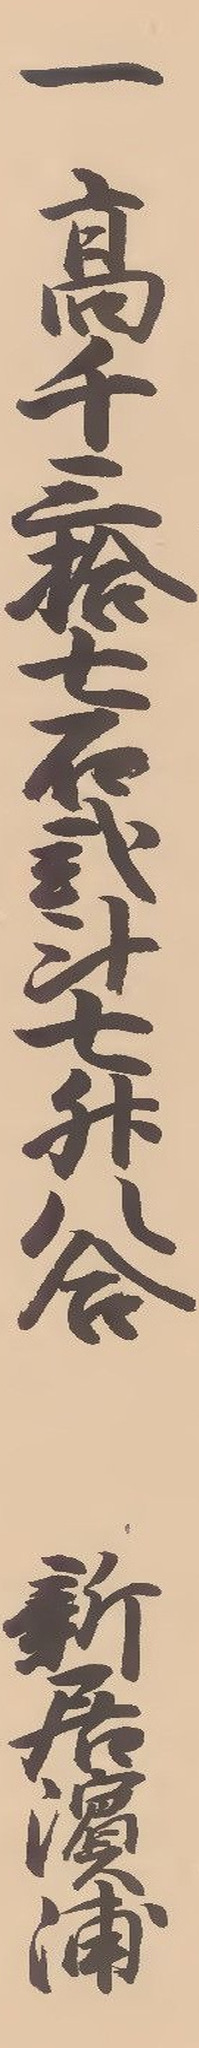一高千三拾七石弐斗七升八合新居浜浦
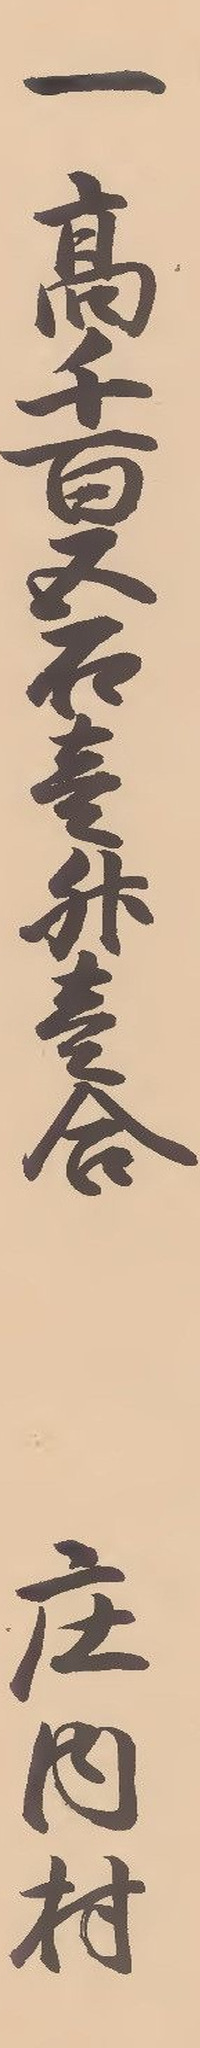一高千百五石壱升壱合庄内村
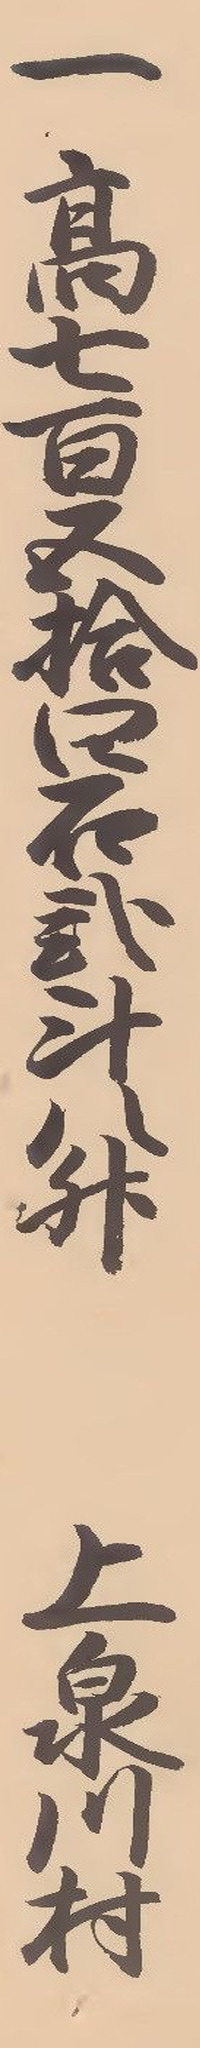一高七百五拾四石弐斗八升上泉川村

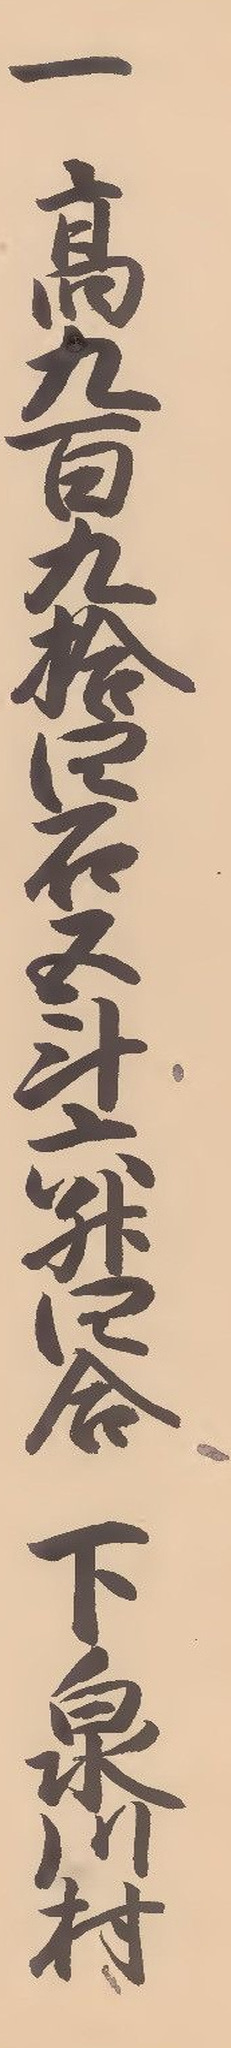一高九百九拾四石五斗六升四合下泉川村
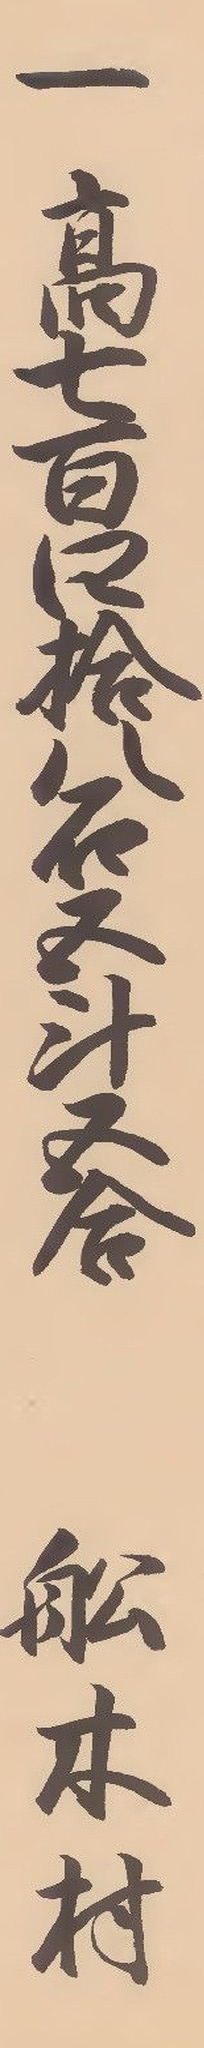一高七百四拾八石五斗五合船木村
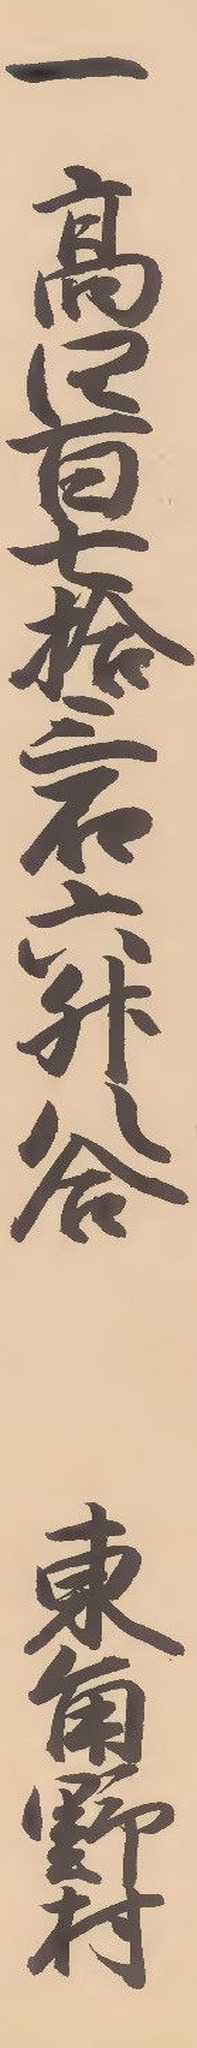一高四百七拾三石六升八合東角野村
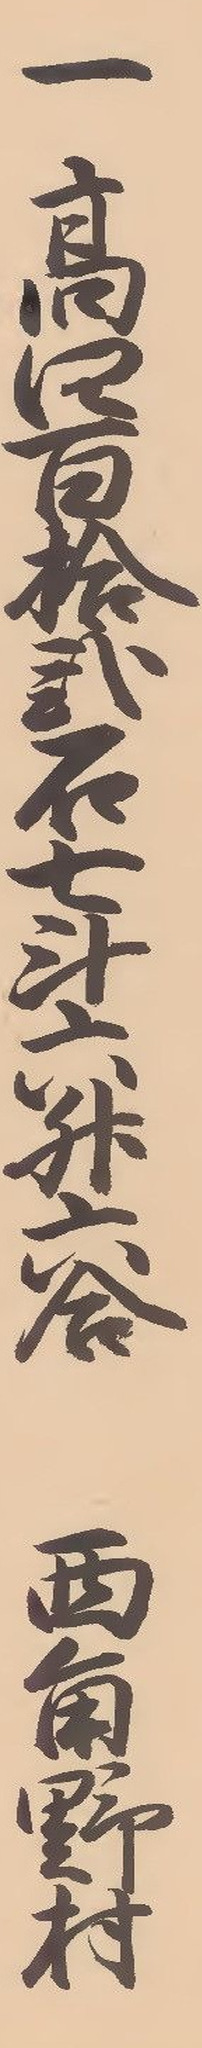一高四百拾弐石七斗六升六合西角野村
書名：伊予国郷帳
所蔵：国立公文書館 National Archives of Japan
